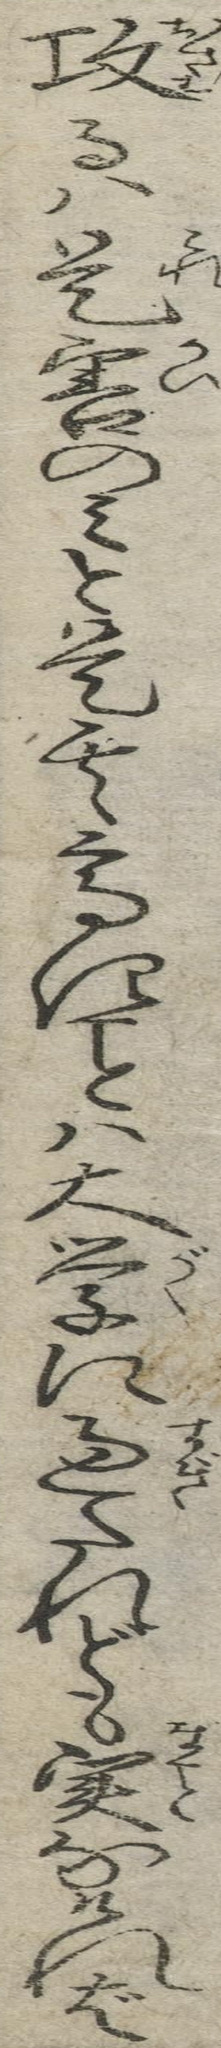攻るは是害のみと是其高きことは大学に過たれども実なければ

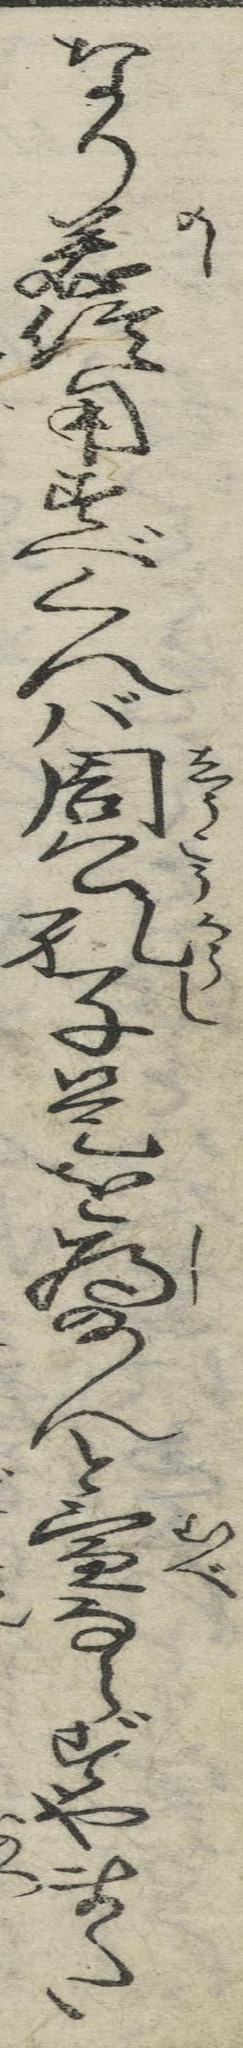なり若作用すべくんば周公孔子是を為なんと宣ならずやまた
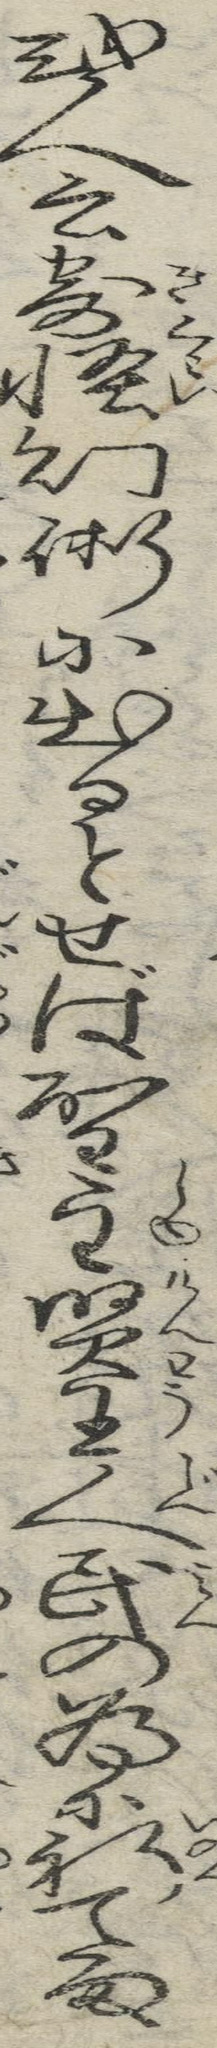或人云奇怪幻術に出るとせば聖主賢王人民の為に祈て雨
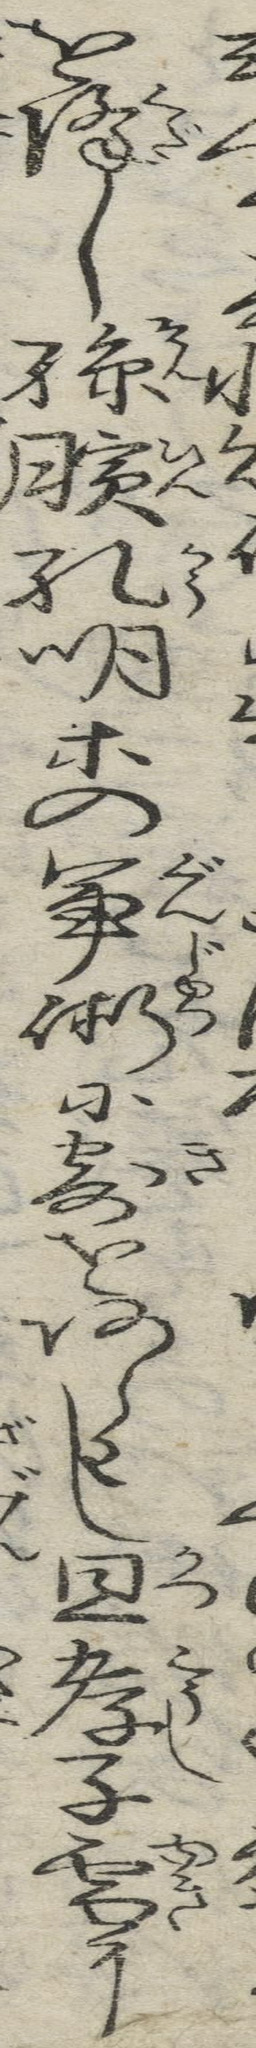を降し孫臏孔明等の軍術に奇をあらわし且孝子雪に
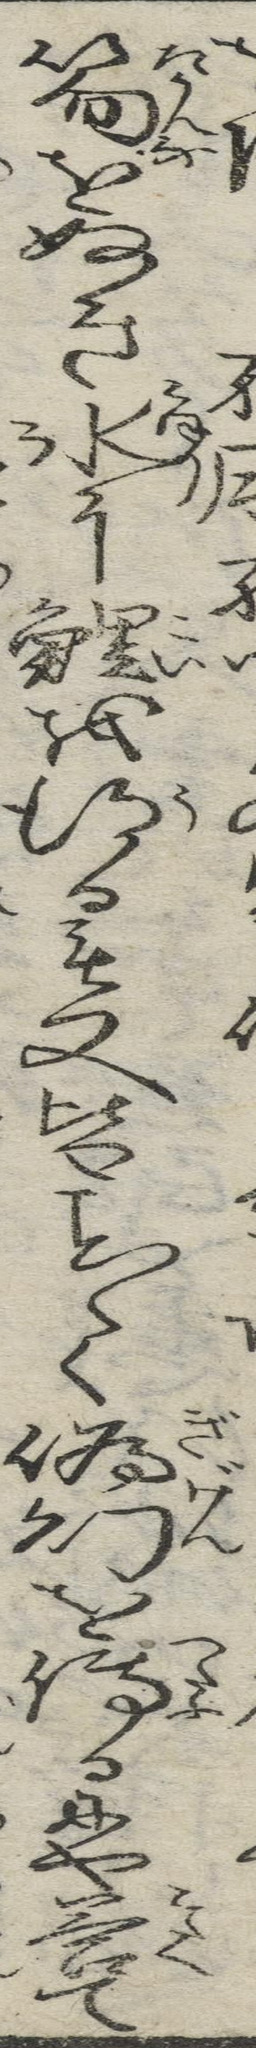筍をぬき氷に鯉を得るも又皆こと〳〵く偽幻を伝るにや答て
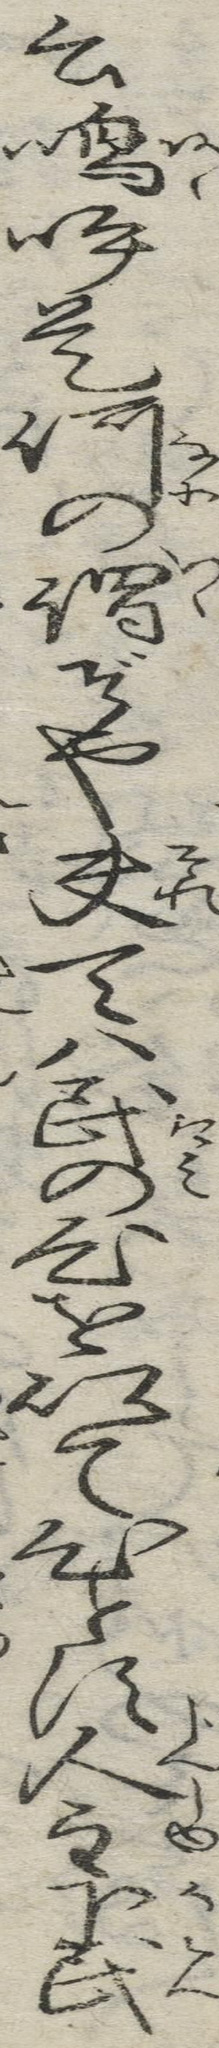云嗚呼是何の謂ぞや夫天は民の心を以て心とす人主下民
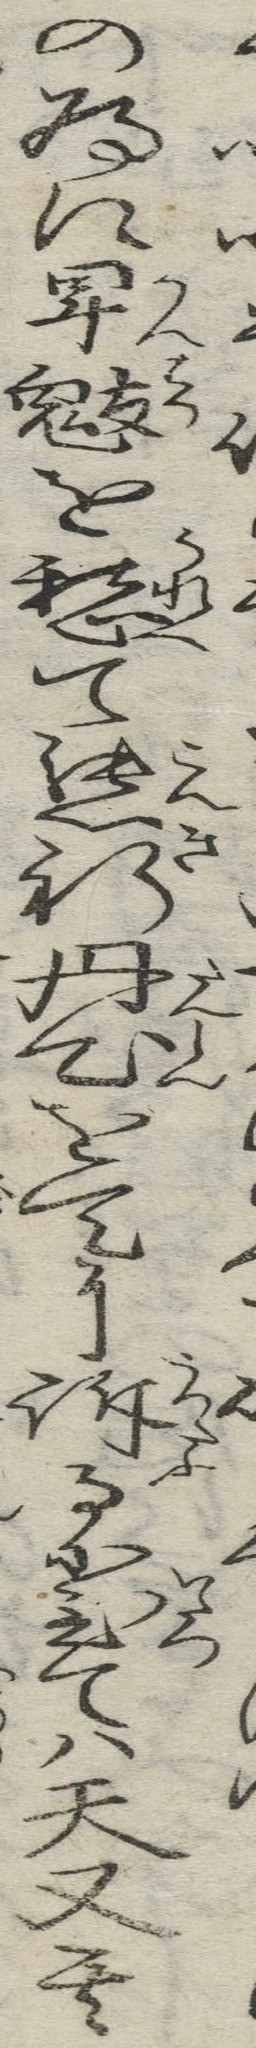の為に旱魃を愁て懇祈丹心を天に訴るに至ては天又其
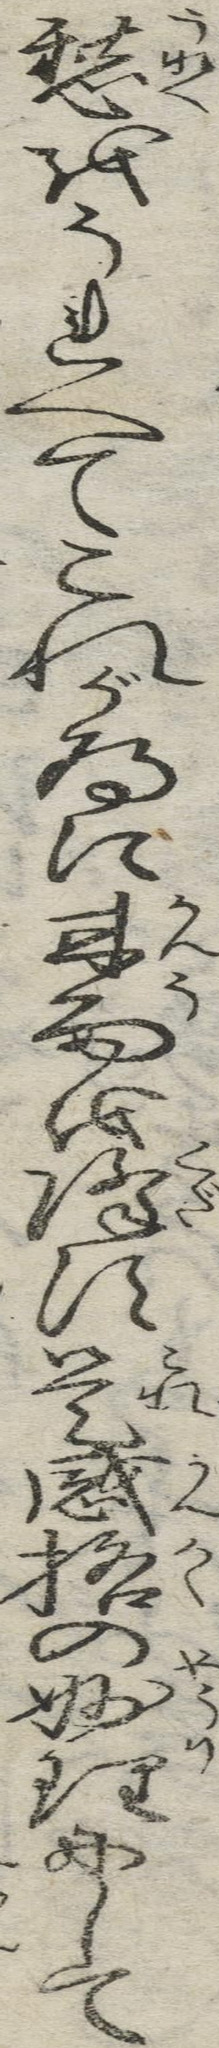愁をうれへてこれが為に甘雨を降す是感格の妙理にして
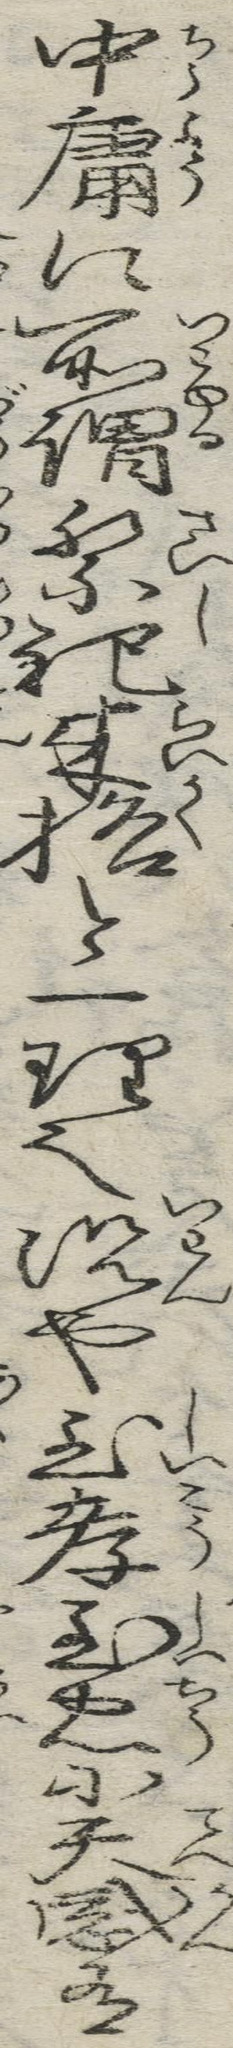中庸に所謂祭祀来格と一理也況や至孝至忠に天感有
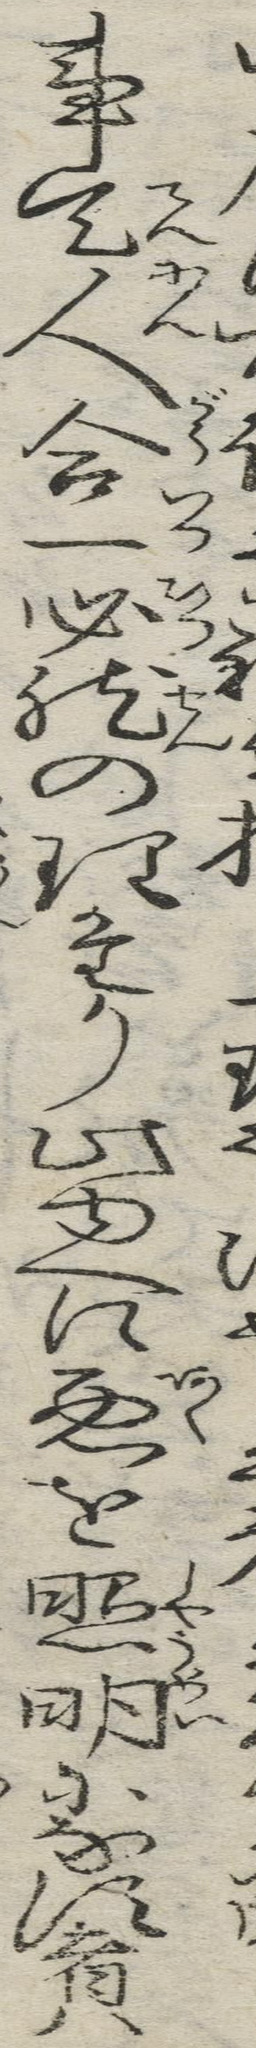事天人合一必然の理たり此ゆへに悪を照明になす者は
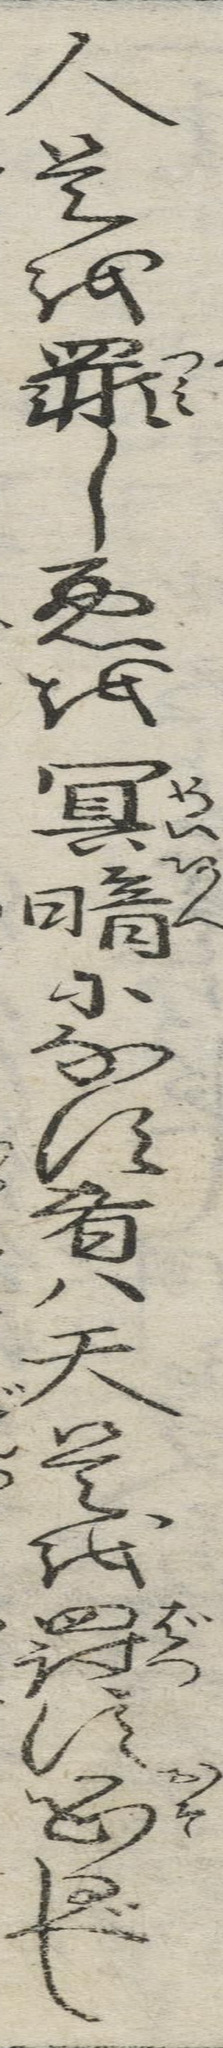人是を罪し悪を冥暗になす者は天是を罰す恐るべし
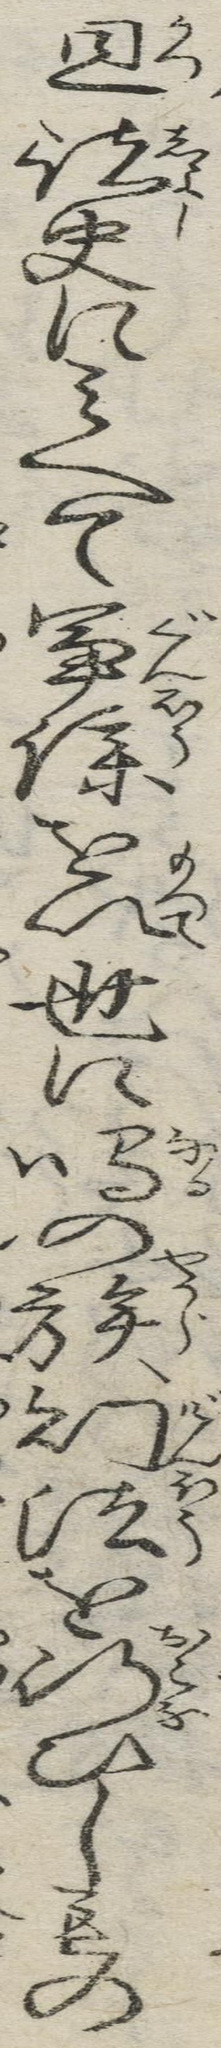且諸史にみへて軍係を以世に鳴の族幻法を行ひしもの
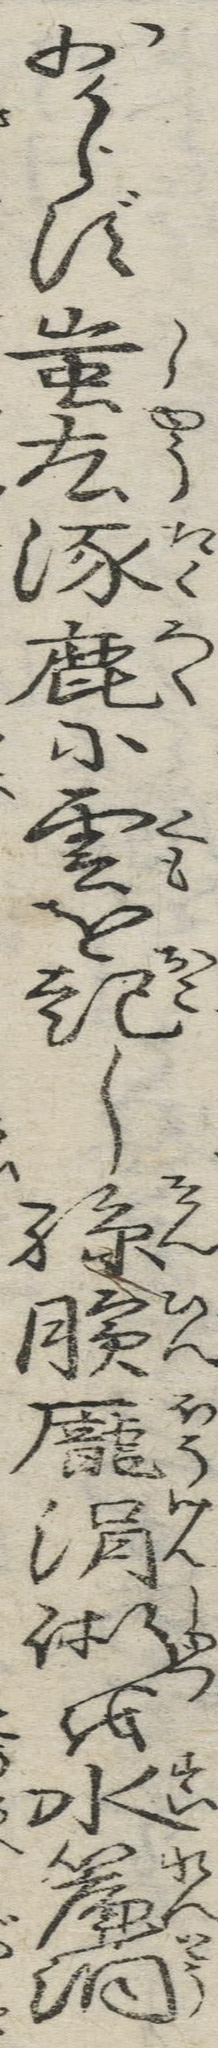少からず蚩尤涿鹿に雲を起し孫臏龐涓術を水簾洞
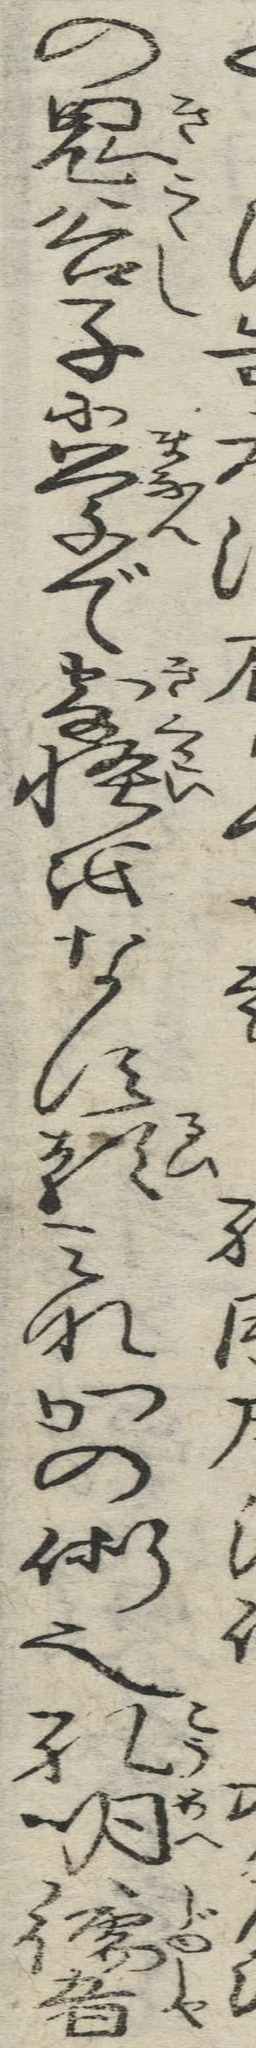の鬼谷子に学で奇怪をなす類みなかの術也孔明儒者
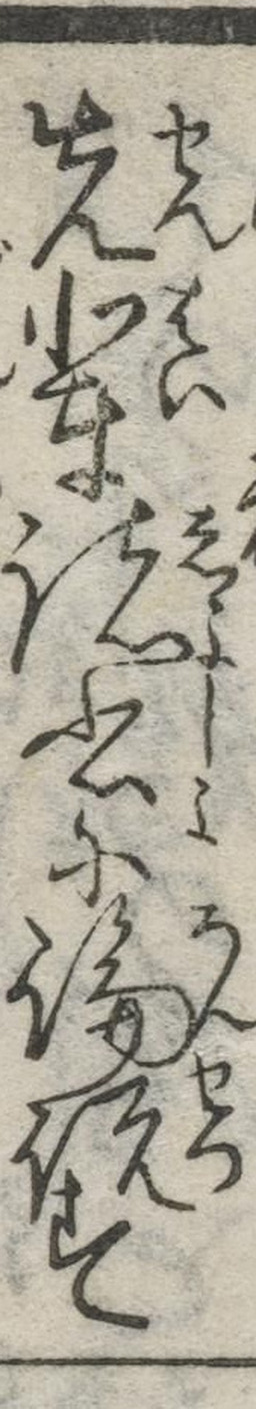先輩諸書に論説す
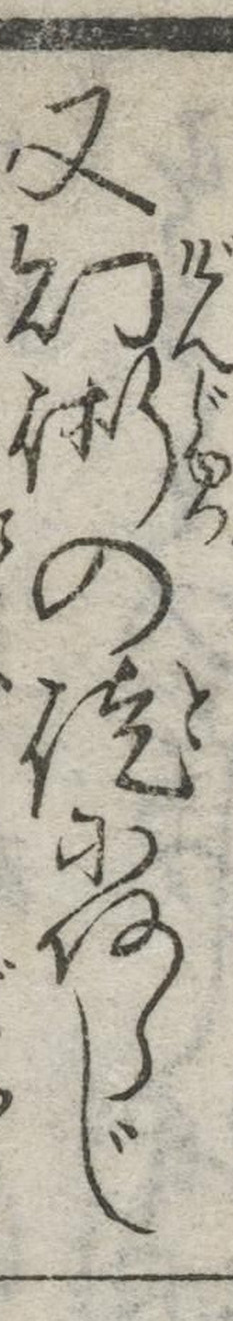又幻術の徒にあらじ
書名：訓蒙天地辨　人
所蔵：東京大学地震研究所図書室 Earthquake Research Institute Library, The University of Tokyo, JAPAN
